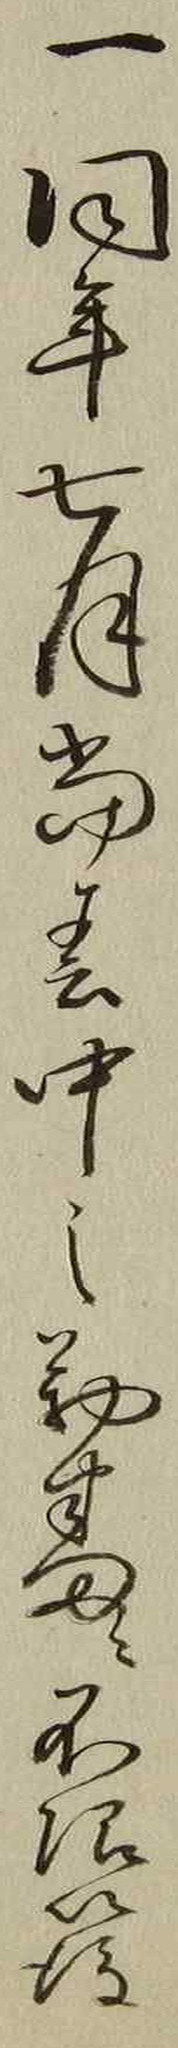一同年七月当春中之勤番ニ不限以後
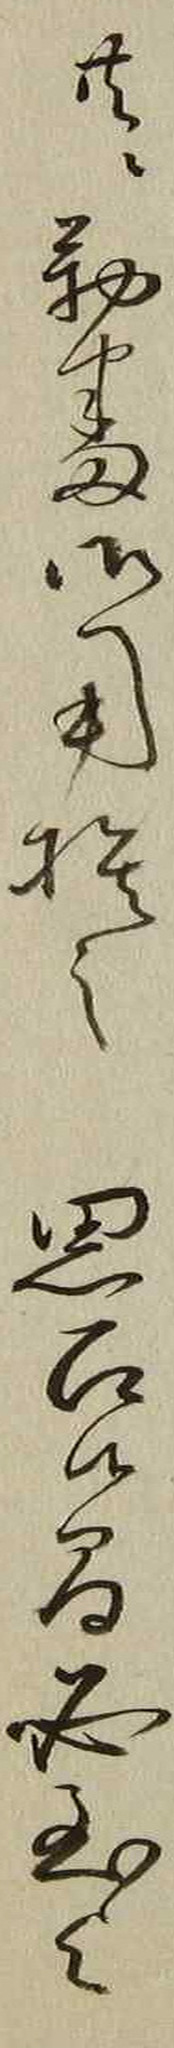共ニ勤番御用捨之思召候間必至と
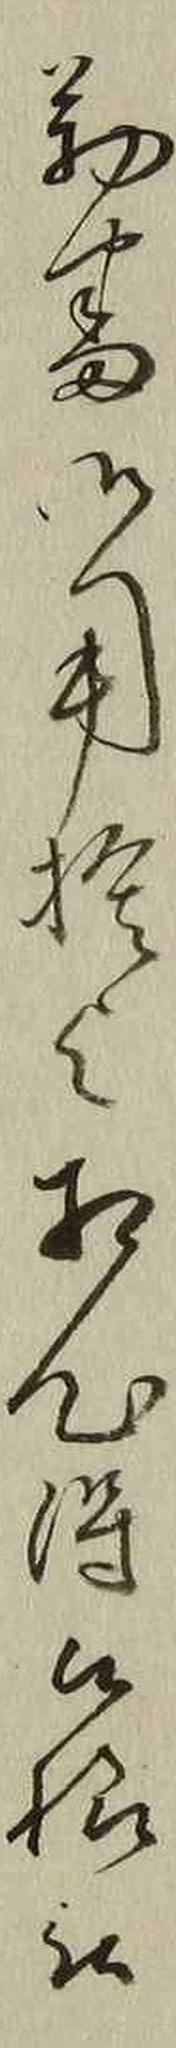勤番御用捨と相心得候様被
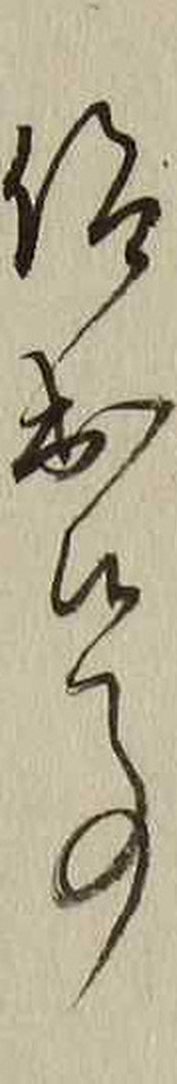仰出候事
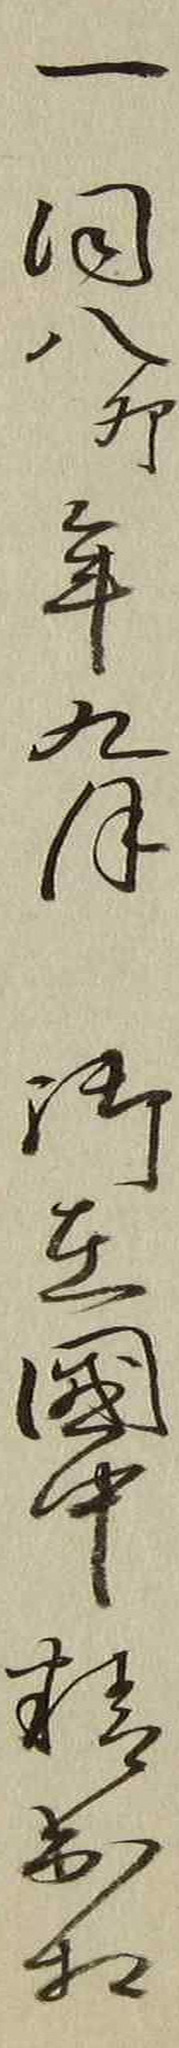一同八卯年九月御在国中精出相
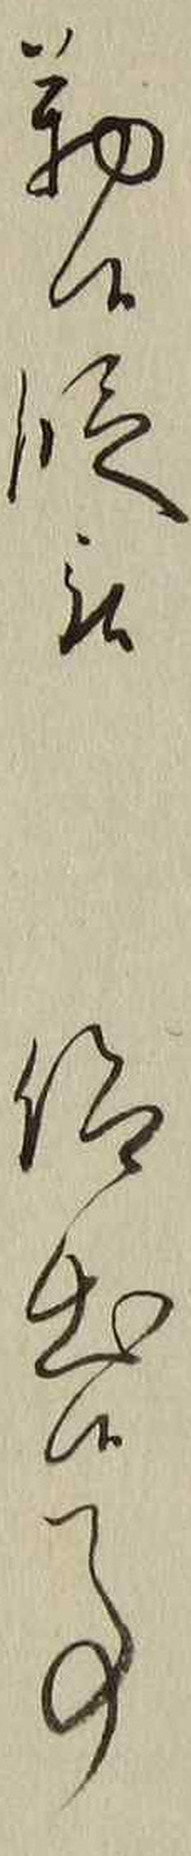勤候段被仰出候事
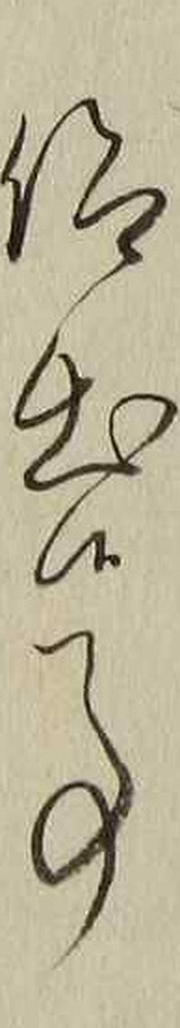仰出候事
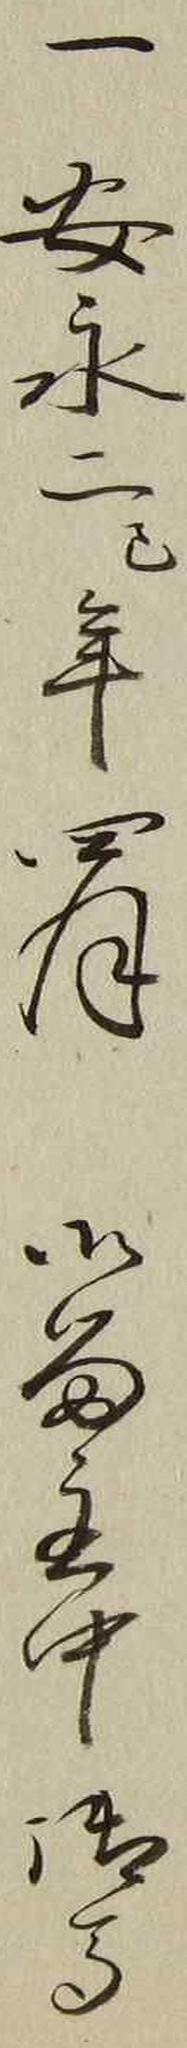一安永二巳年四月御留守中御馬
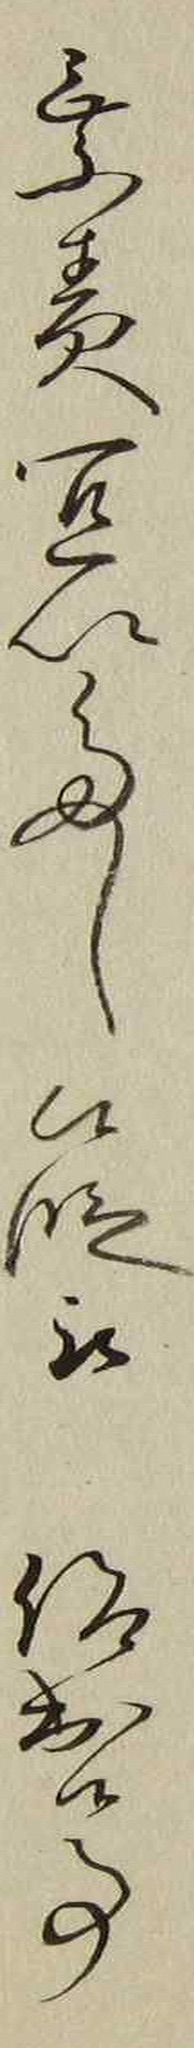乗責宜いたし候段被仰出候事
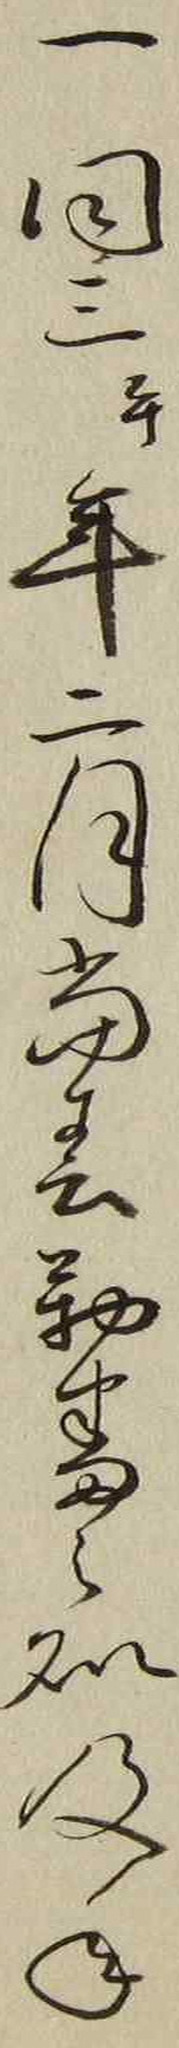一同三午年二月当春勤番之処及年
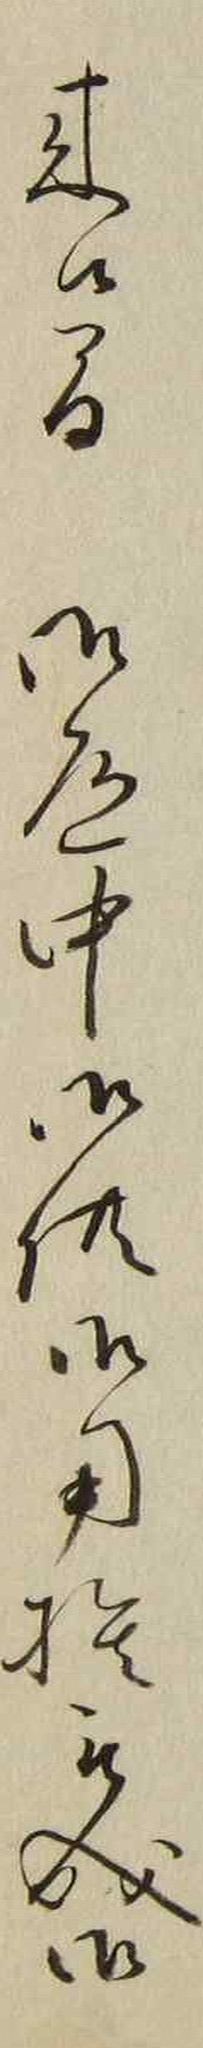来候間御道中御供御用捨被成御

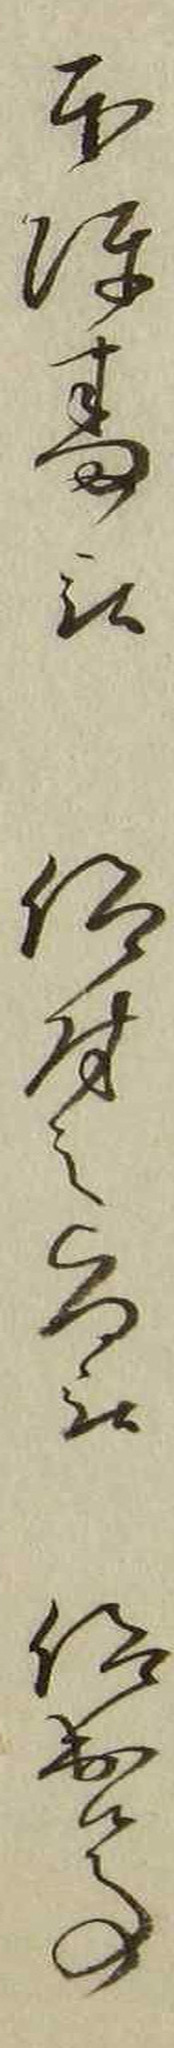本陣番被仰付之旨被仰出候事
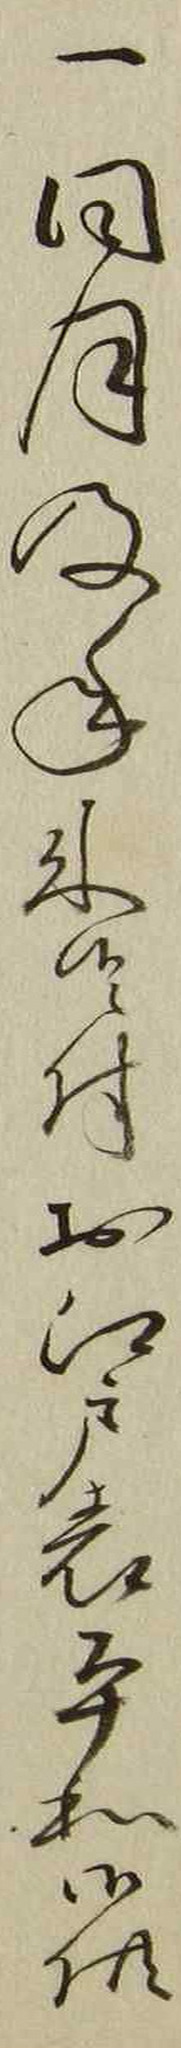一同月及年来候ニ付於江戸表平和御供
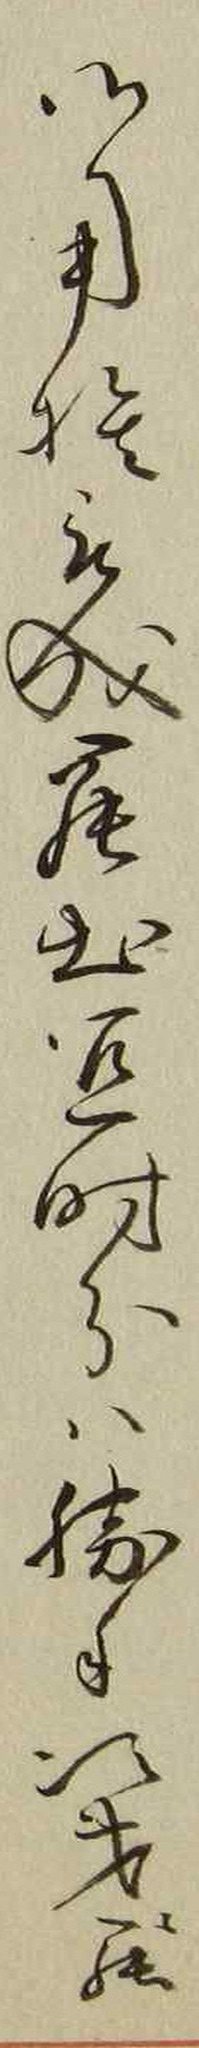御用捨被成罷出宜時分ハ勝手次第ニ罷
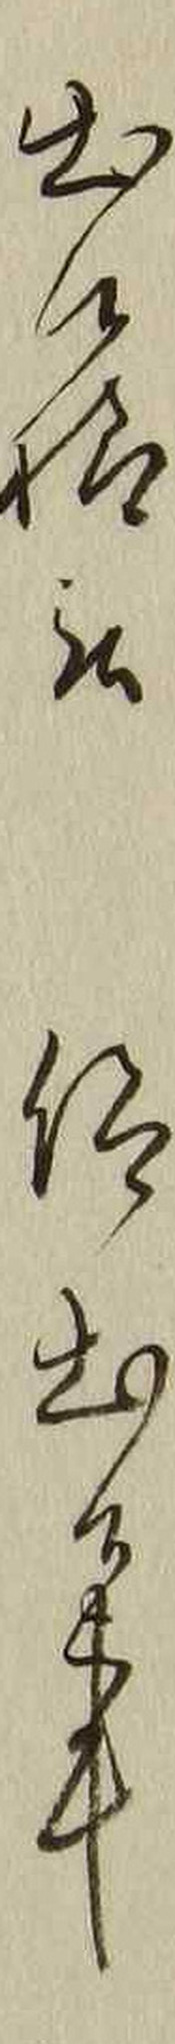出候様被仰出候事
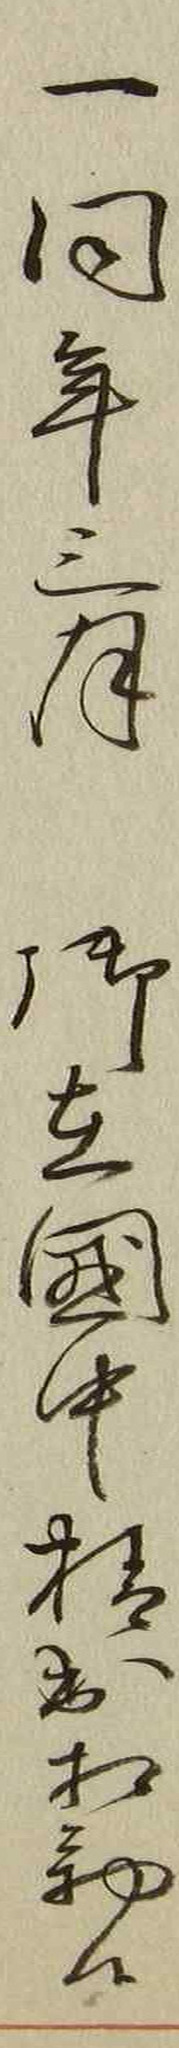一同年三月御在国中精出相勤候
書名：諸士系譜　巻之3　い之部3
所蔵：会津若松市立会津図書館
